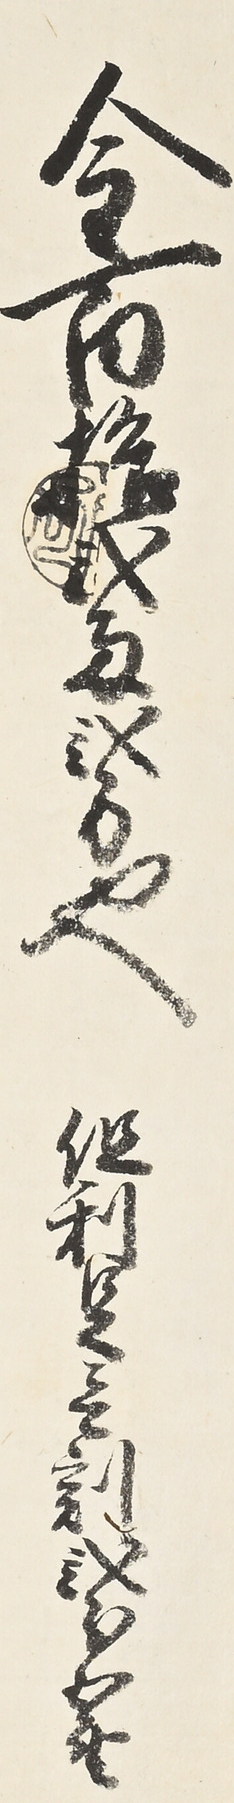金百拾弐両弐分也但利足壱割弐分五厘
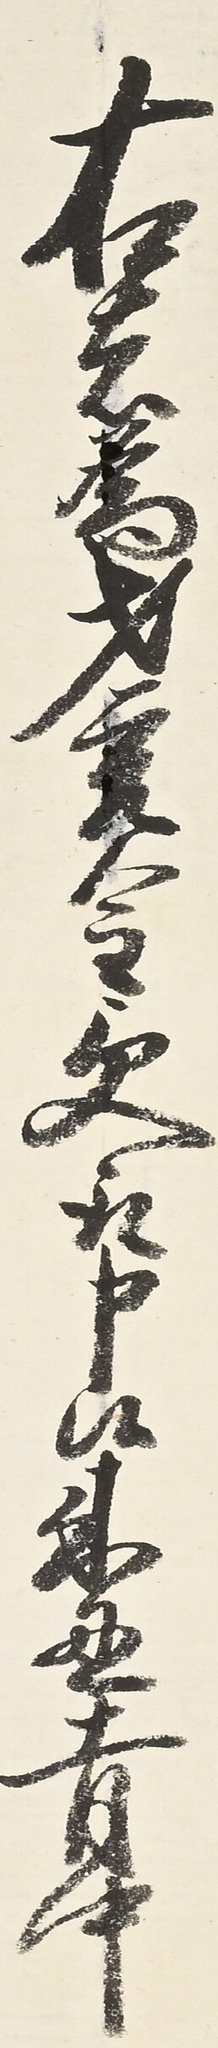右は為才覚金受取申候来丑十一月中
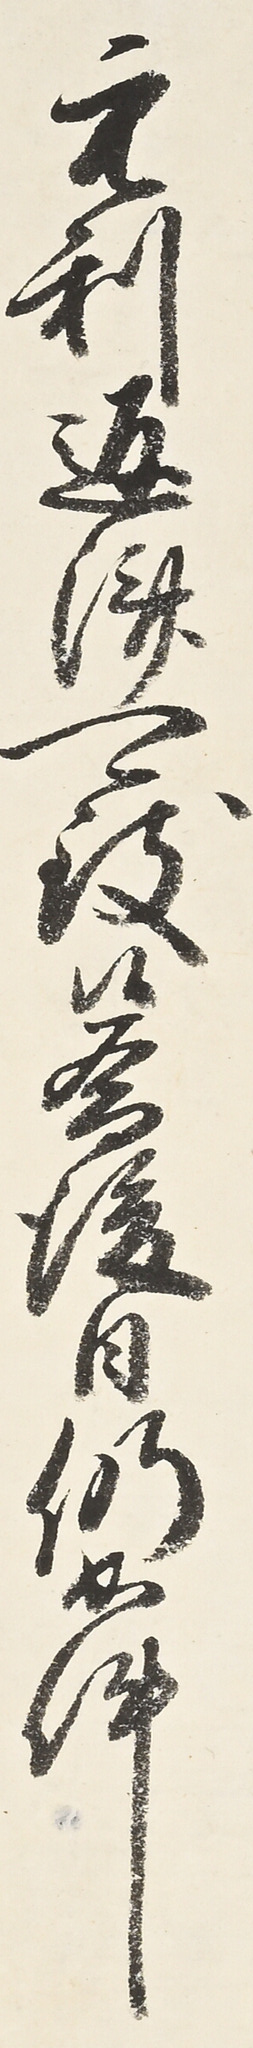元利返済可致候為後日仍如件
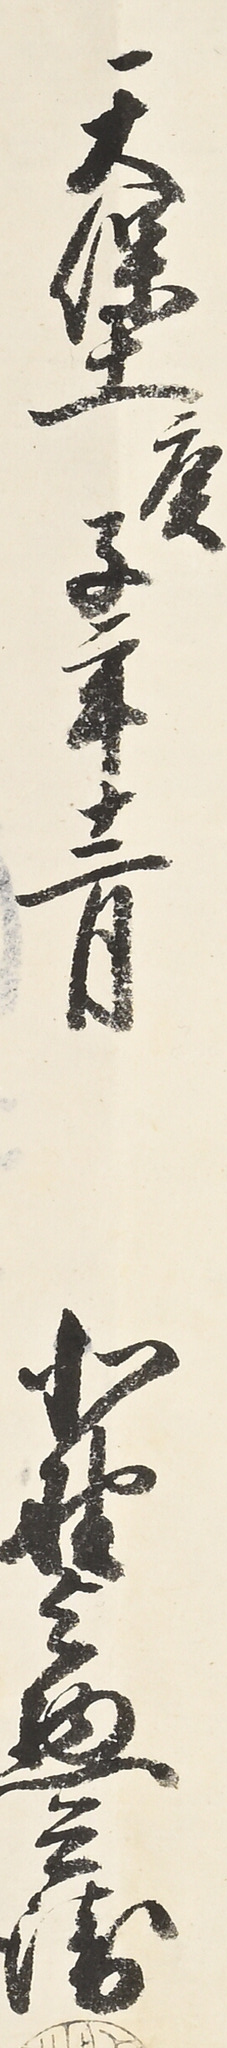天保十一庚子年十二月北野与惣兵衛㊞
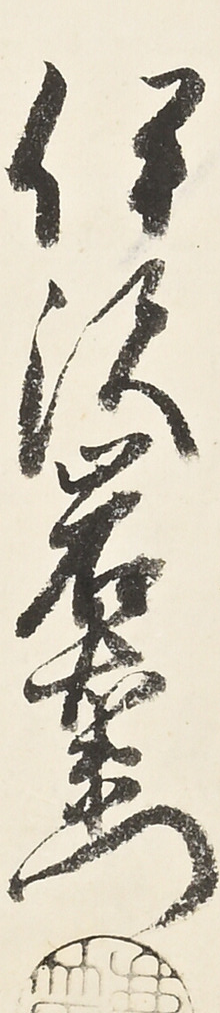伊沢岩右衛門㊞
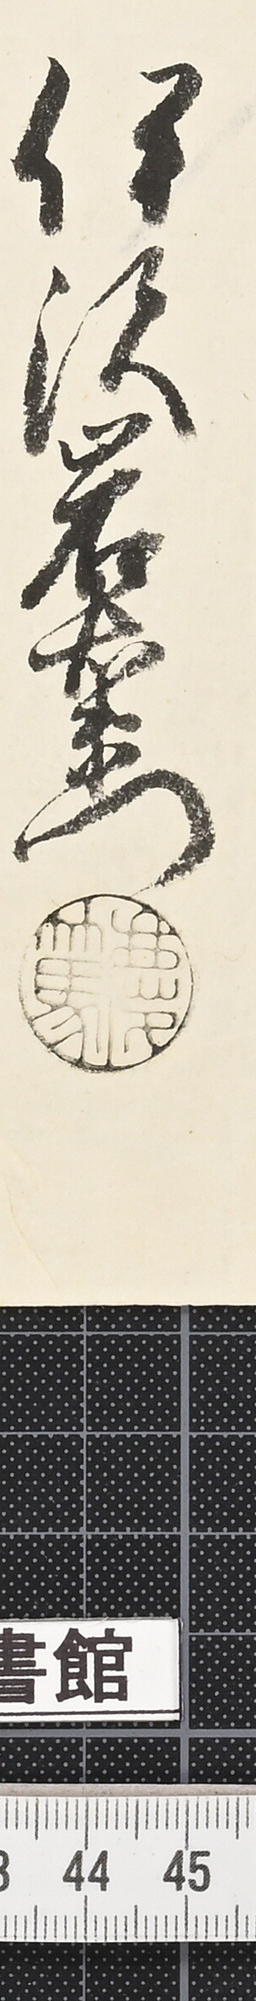伊沢岩右衛門㊞
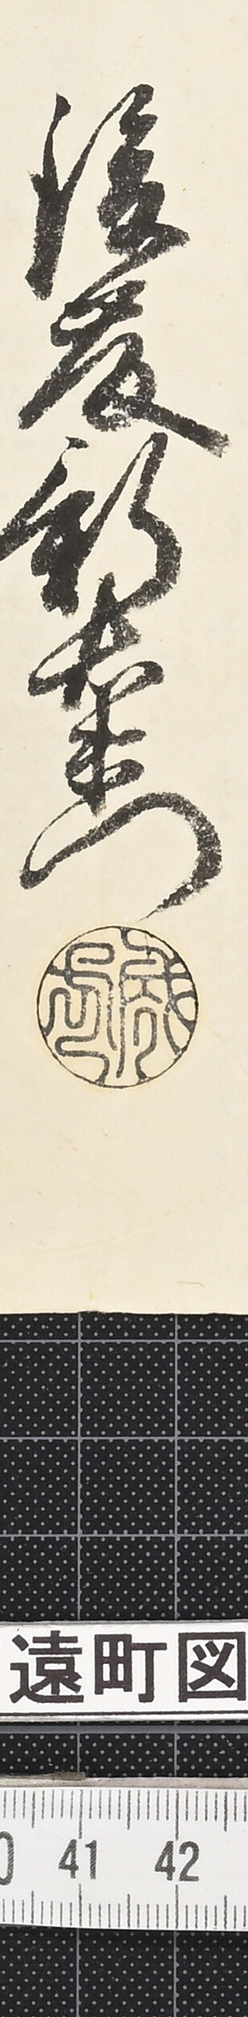後藤新右衛門㊞
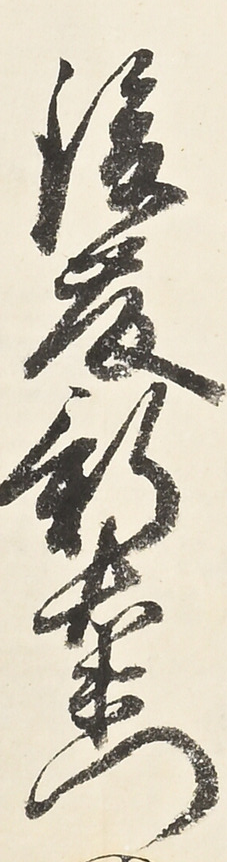後藤新右衛門㊞
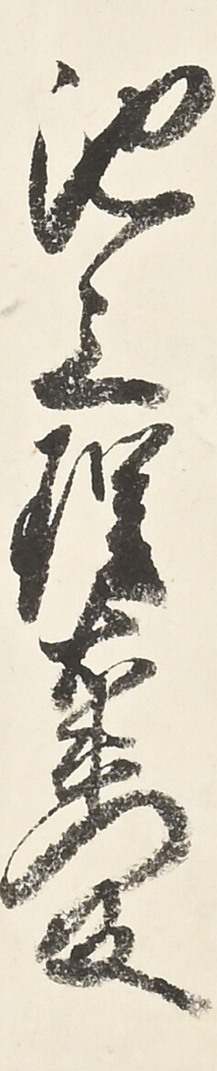池上理右衛門殿
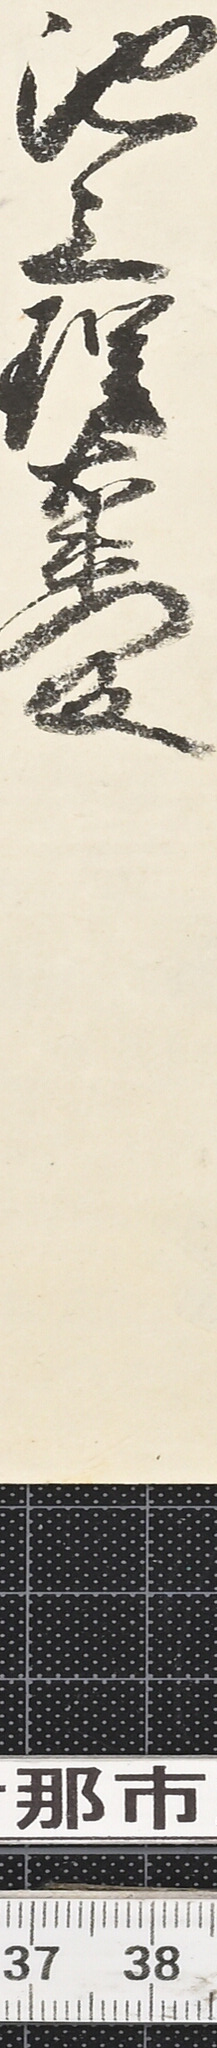池上理右衛門殿
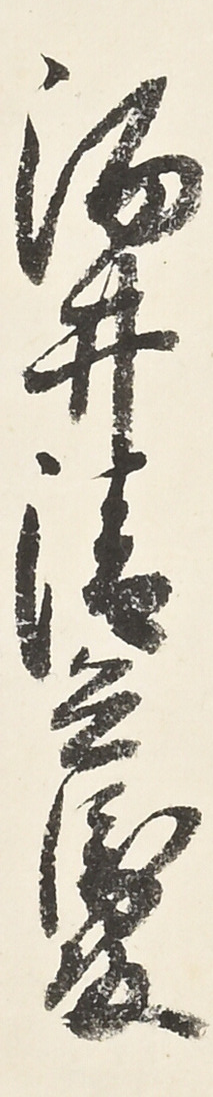酒井清兵衛殿
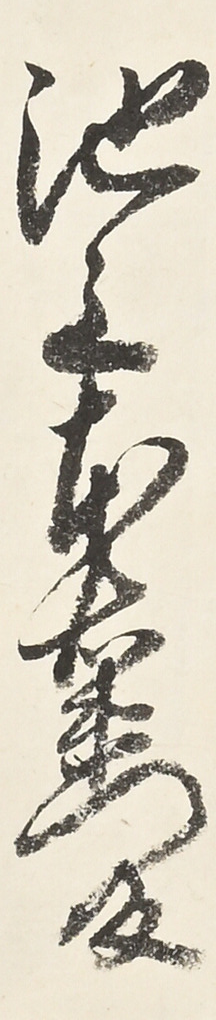池上本右衛門殿

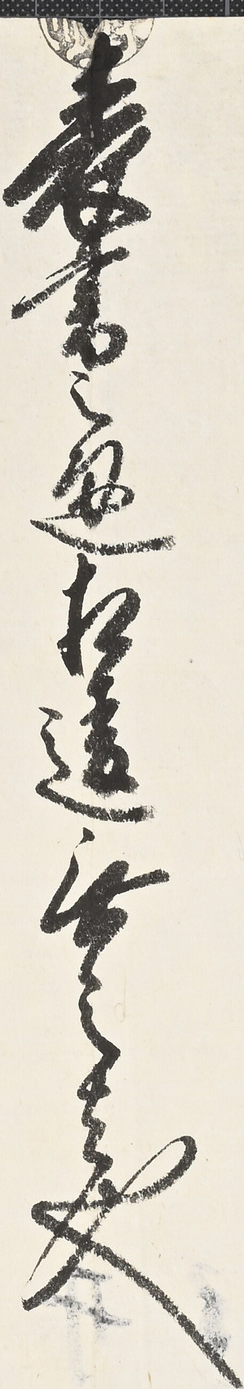表書之通相違無之者也

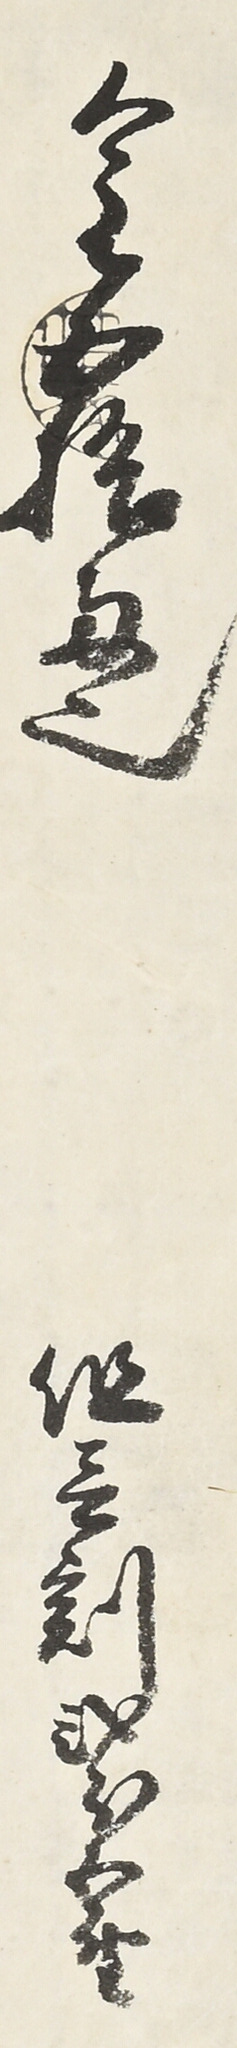金五拾両也但壱割弐分五厘
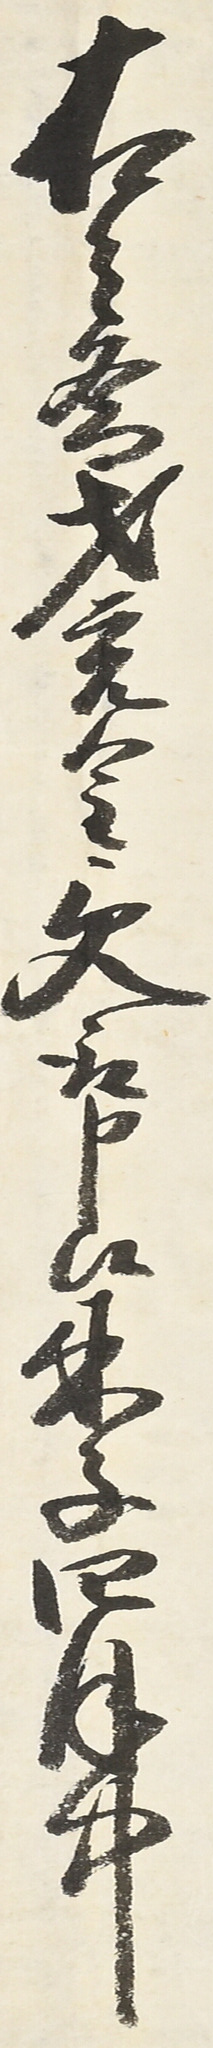右之為才覚金受取申候来子四月中
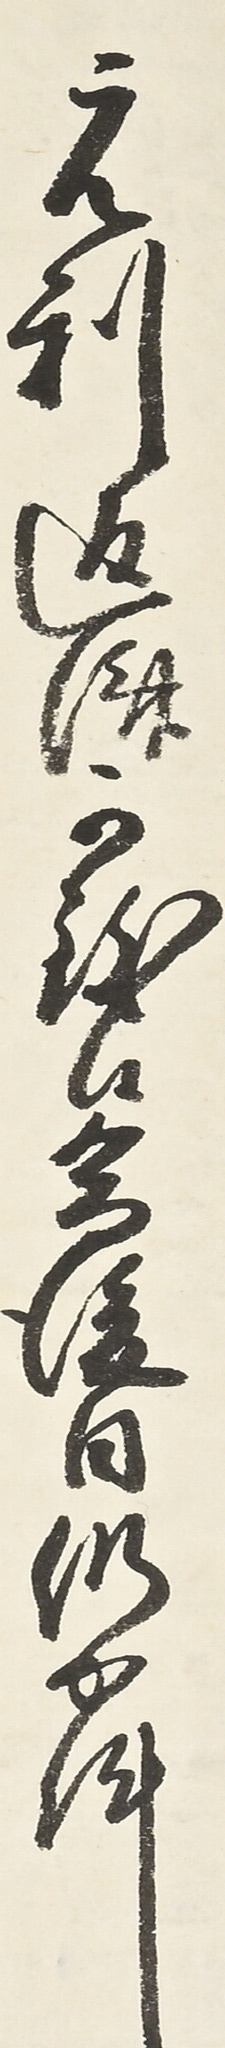元利返済可致候間後日仍如件
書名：覚
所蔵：伊那市立高遠町図書館・合同会社AMANE
